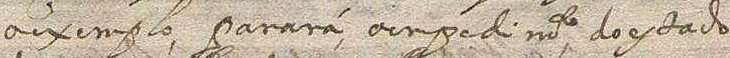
o exemplo, parará, o impedimto, de estado
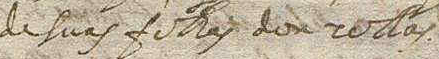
de suas filhas donzellas.
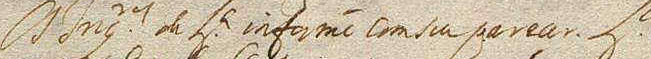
Os Inq.res de Lx.a informē com seu pareçer. Lx.a
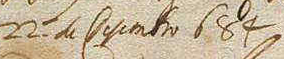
22. de Desembro 684
